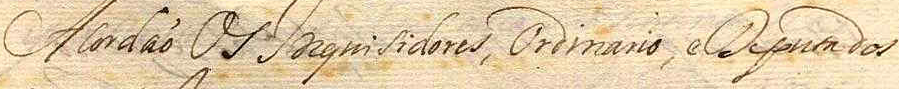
Acordaõ os Inquisidores, Ordinario, e Deputados
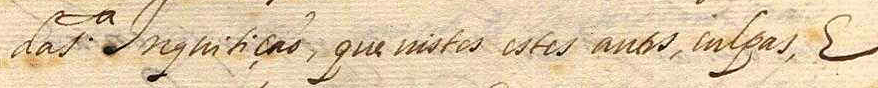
da S.ta Inquisiçaõ, que uistos estes autos, culpas, E
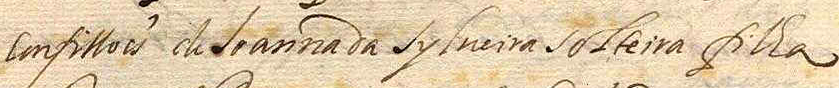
confissoẽs de Ioanna da Sylueira solteira filha
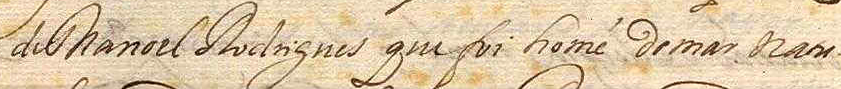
de Manoel Rodrigues que foi homẽ de mar natu
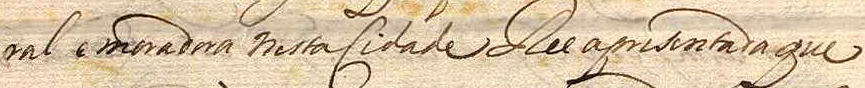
ral e moradora nesta Cidade Ree apresentada que
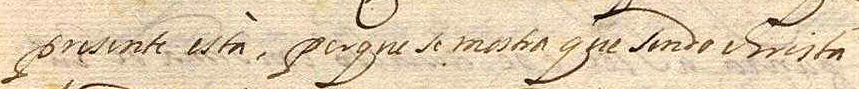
presente està, perque se mostra que sendo christã
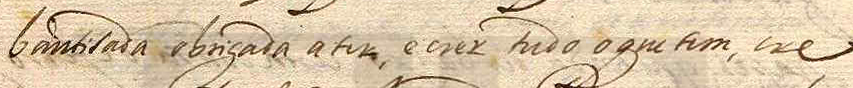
bautisada obrigada a ter, e crer tudo o que tem, cre
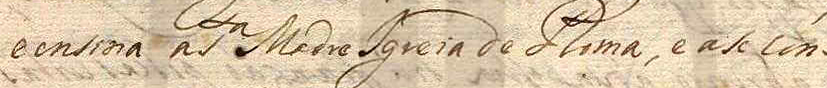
e ensina a S.ta Madre Igreja de Roma, e a se con
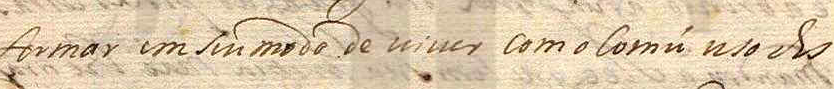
formar em seu modo de uiuer com o Comū uso dos
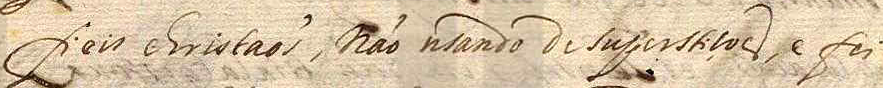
fieis Christaōs, naõ usando de superstiçoẽs e fei
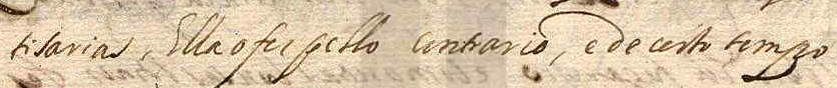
tisarias, Ella o fez pello contrario, e de certo tempo
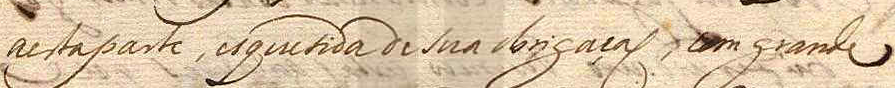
a esta parte, esquesida de sua obrigaçaõ, com grande
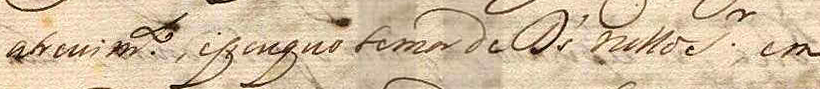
atrevim.to, e pouquo temor de Ds̄ nosso S.r em
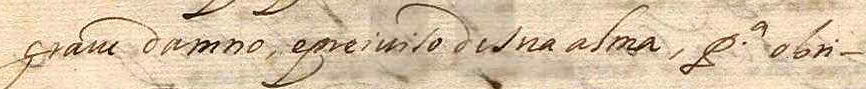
graue damno, e preiuiso de sua alma, p.a obri
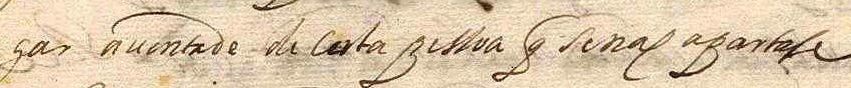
gar a uontade de certa pessoa q̄ se naõ apartase
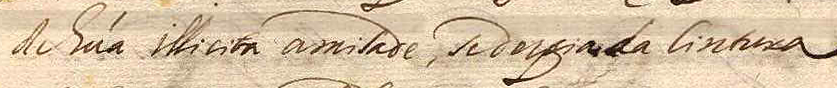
de hūa illicita amisade, se despia da cintura
